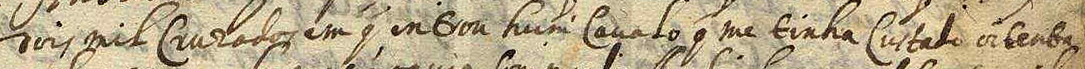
dois miL Cruzados em q̄ entrou hum CauaLo q̄ me tinha Custado oitenta
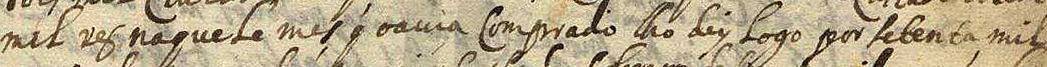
miL res̄ naqueLe mes q̄ o auia Comprado lho dey Logo por setenta mil
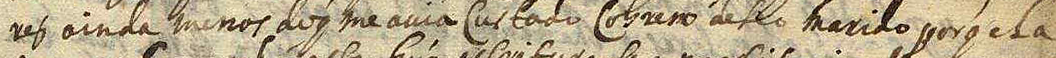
res̄ ainda menos do q̄ me auia Custado Cobrem de seo marido por q̄ eLa
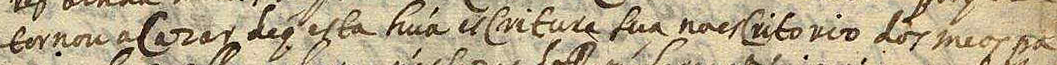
tornou a Cazar de q̄ esta huā esCritura sua no esCritorio dos meos pa
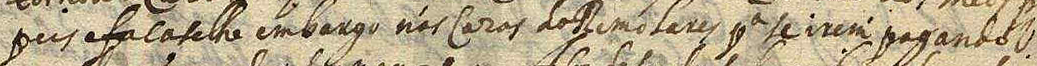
peis a facaselhe embargo nas Cazas do RemoLares pa se irem pagando V.
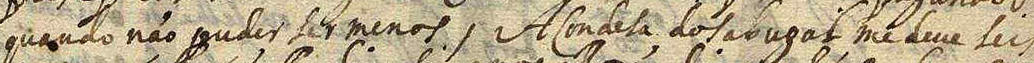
quando não puder ser menos, A Condesa do sabugaL me deue seis
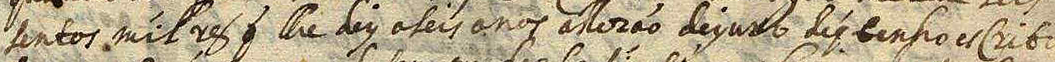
sentos mil res̄ q̄ lhe dey a seis anos a Rezão de yuro de q̄ tenho esCrito
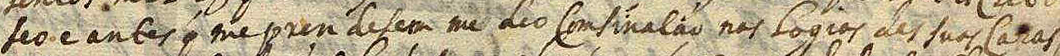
seo e antes q̄ me prendesem me deo ComsinaCao nos Logios das suos Cazas
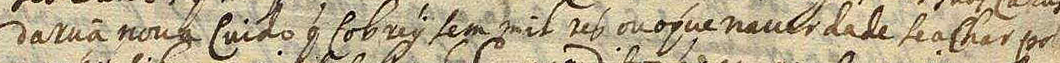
da ruá noua Cuido q̄ Cobrey sem mil res̄ ou o que na uerdade se aChar po
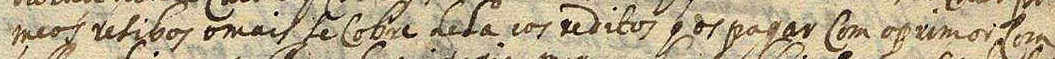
meos resibos o mais se Cobre deLa e os reditos q̄ os pagar Com o primor Com
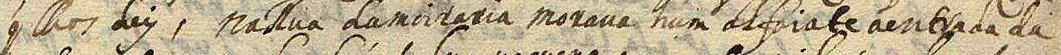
q̄ lhos dey, na Rua da moiraria moraua hum aLfaiate a entrada da
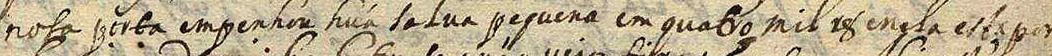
nosa porta empenhou huā saLua pequena em quatro mil res̄ e nela esta por
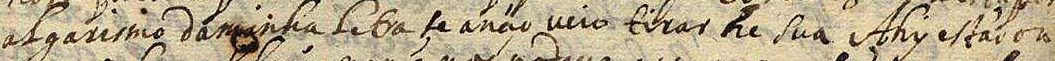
aLgarismo da minha Letra se a não ueio tirar he sua Ahy estaõ ou
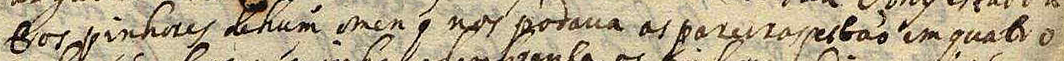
tros pinhores de hum omen q̄ nos podaua as pareiras estaõ em quatro
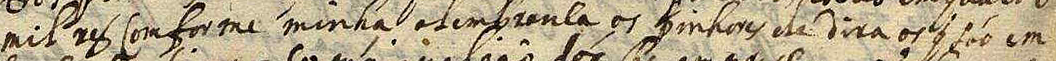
mil res̄ Comforme minha aLembrenCa os pinhores ela dira os q̄ saõ em
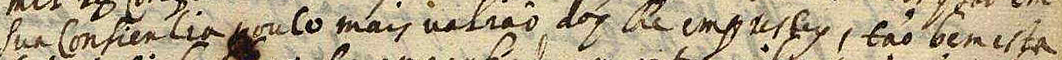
sua ConsienCia pouCo mais uaLiaõ do q̄ lhe emprestey, taõ bem esta
